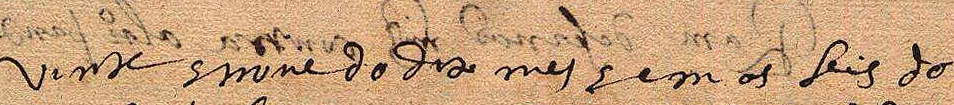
vinte E noue do dito mes E em os seis do
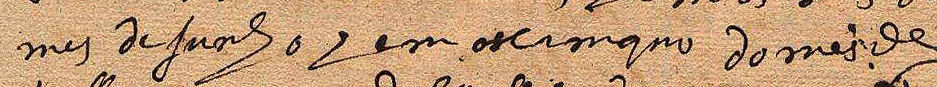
mes de Junho E em os cimquo do mes de
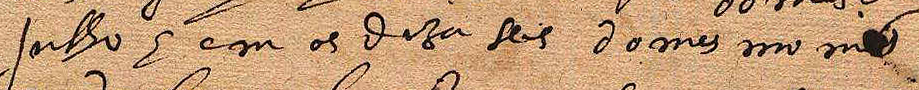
Julho E em os dezaseis do mesmo mes
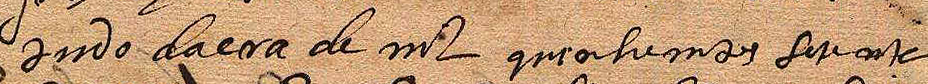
tudo da era de miL quinhemtos setenta
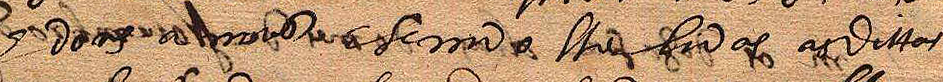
E dous annos e semdo lhe lidas as dittas
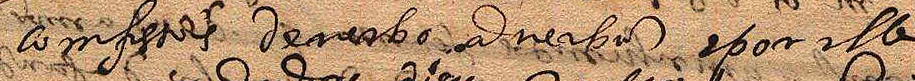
comfissoĩs de uerbo ad uerbū e por elle
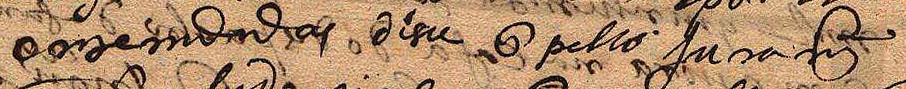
entemdidas disse q̄ pello Juramto
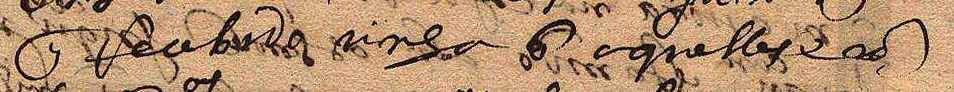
q̄ Recebido tinha q̄ aquelles erō
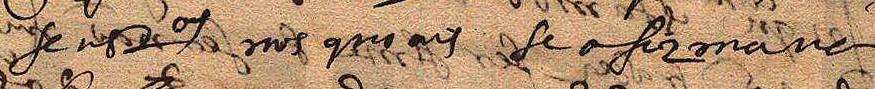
seus tos nos quoais se afirmaua
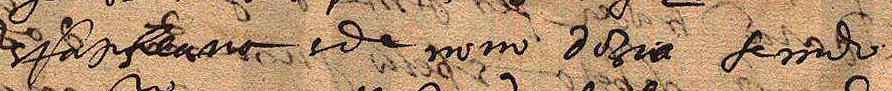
E Ratificaua e de nouo dizia semdo
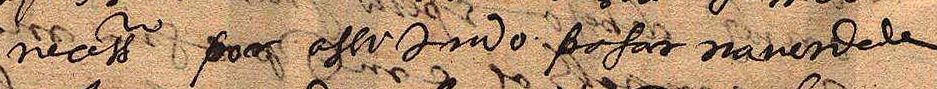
necessrio por assi tudo pasar na uerdade
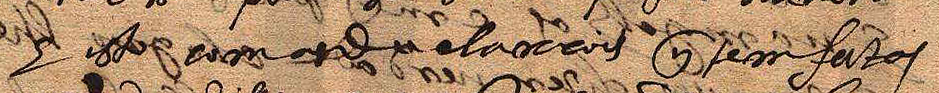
E isto com as declaracois q̄ tem feitas
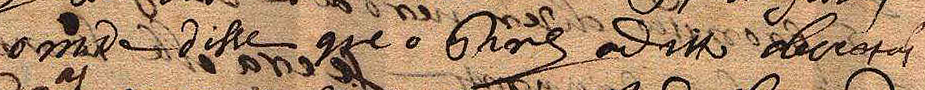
omde disse que o q̄ tinha ditto de certas
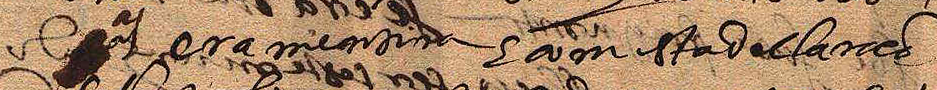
pas era mentira E com esta declaracō
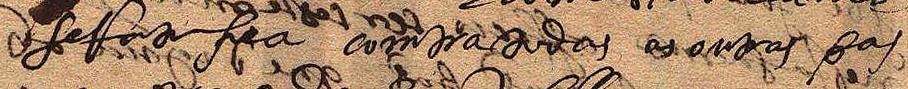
se Ratifica comtra todas as outras p̄as
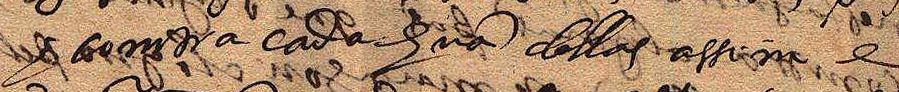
E comtra cada huā dellas assim e
